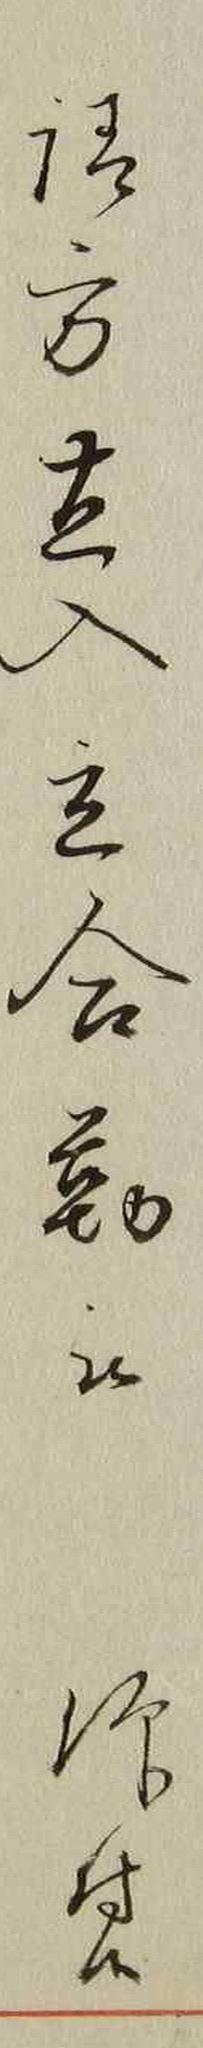請方立入立合勤被仰付候
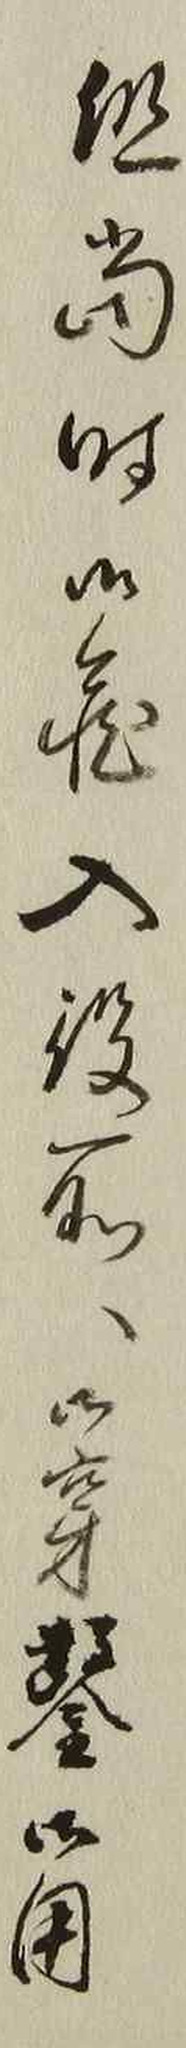但当時御蔵入役所へ御穿鑿御用
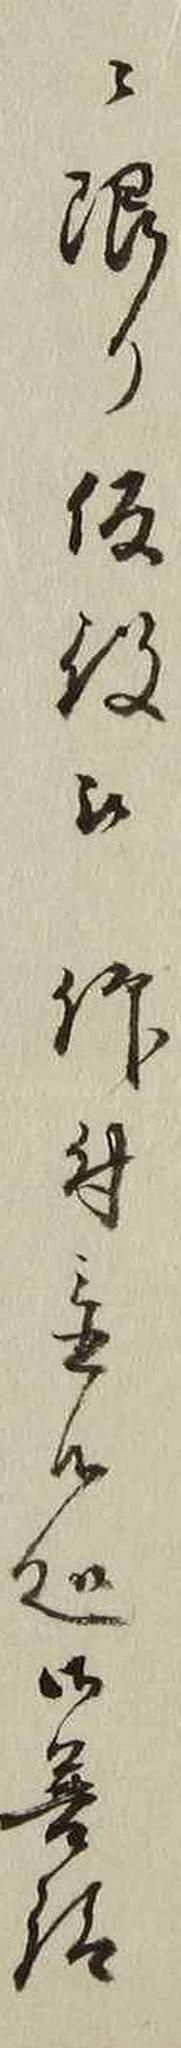ニ限り仮役被仰付置候処御普請
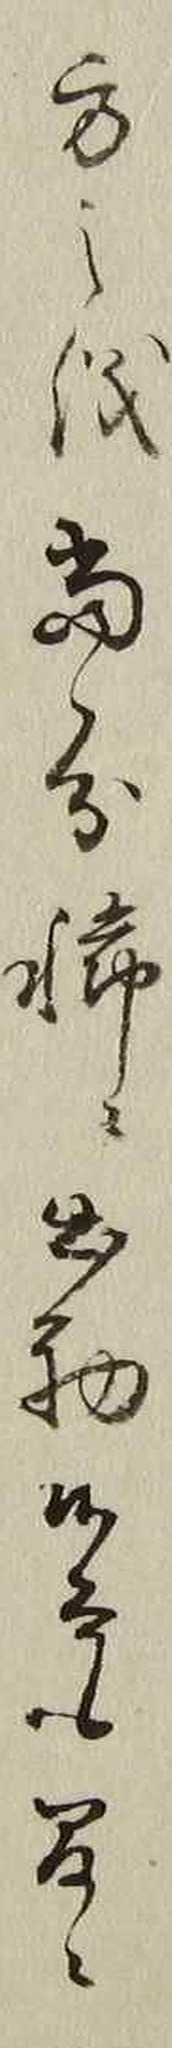方之儀当分稀ニ出勤候而も間ニ
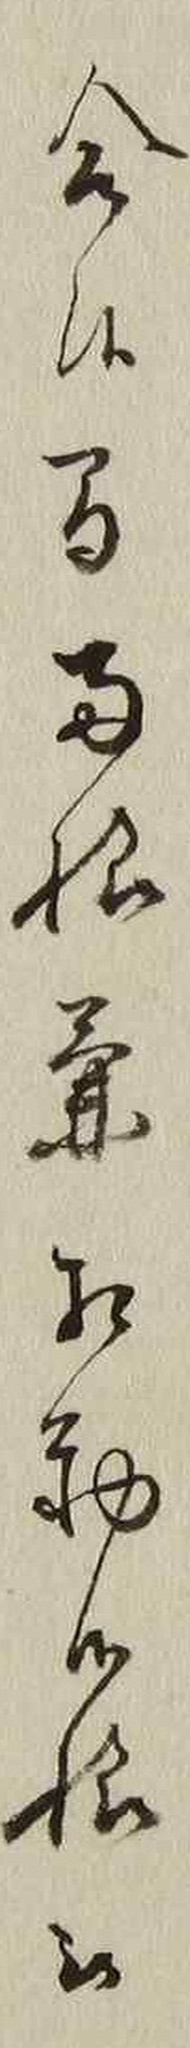合候間両様兼相勤候様被
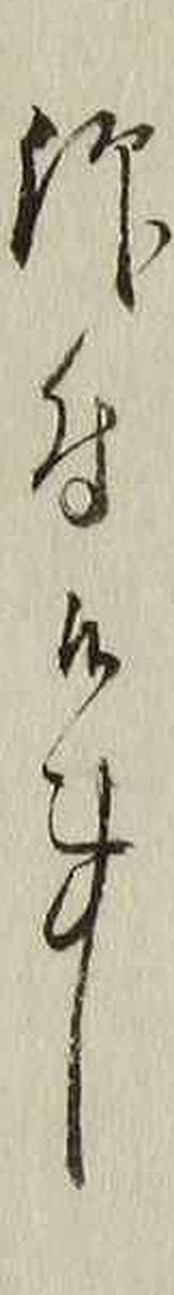仰付候事
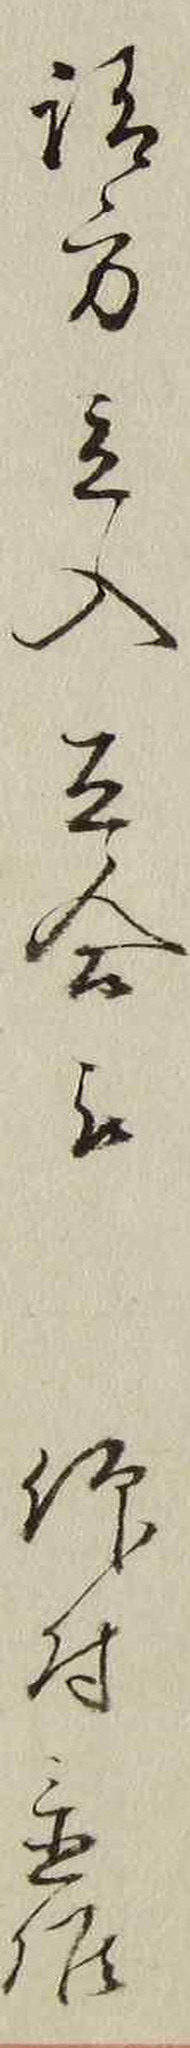請方立入立合被仰付置候
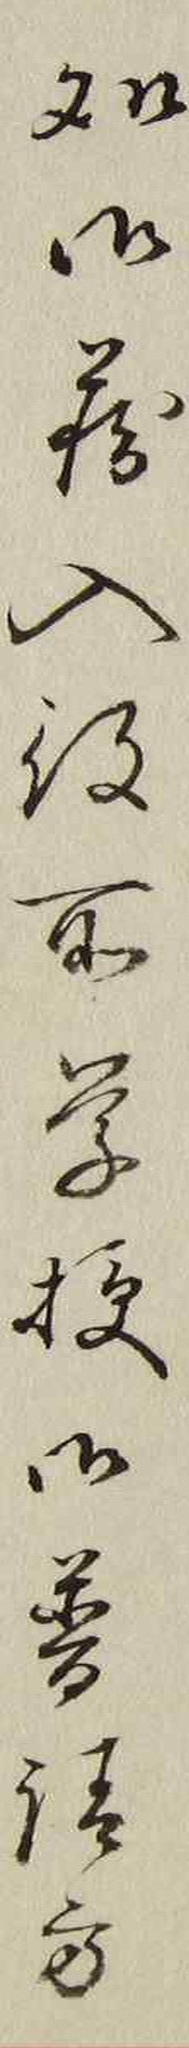処御蔵入役所学校御普請方
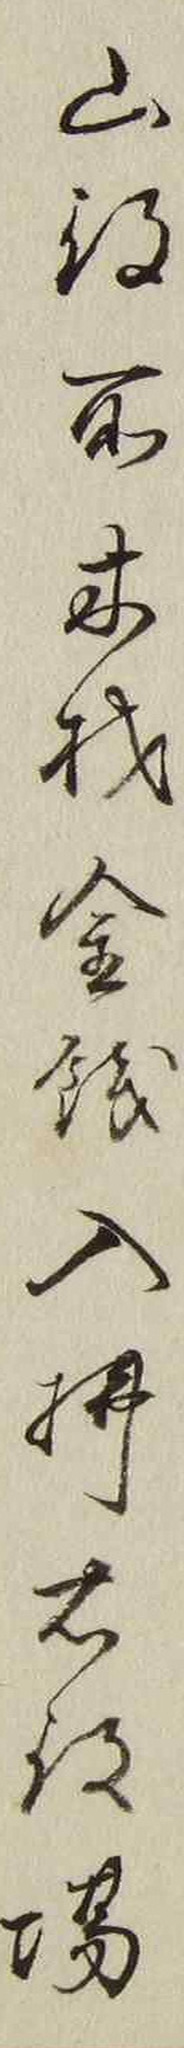山役所木材金銭入払右役場
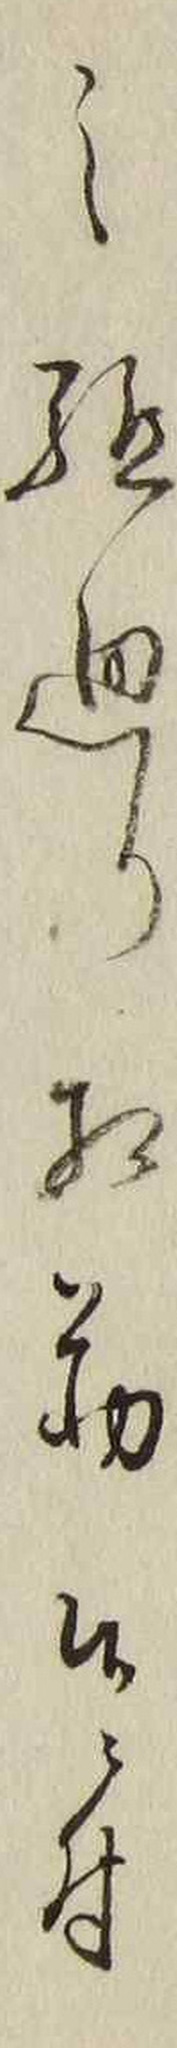之組廻り相勤候ニ付

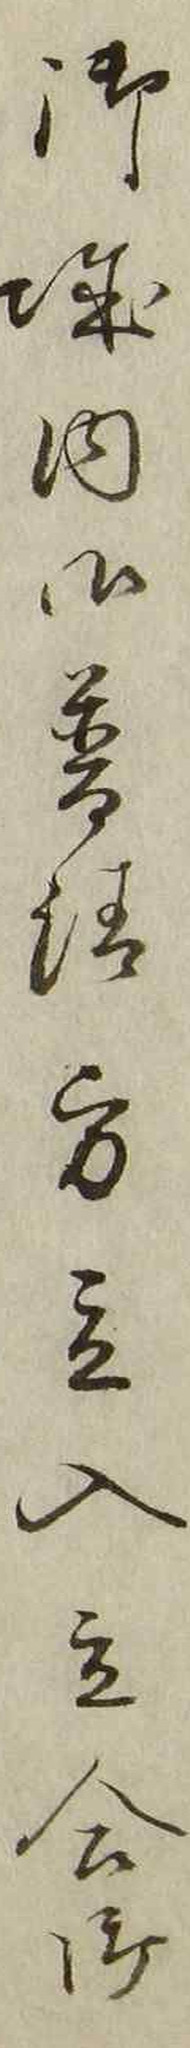御城内御普請方立入立合御
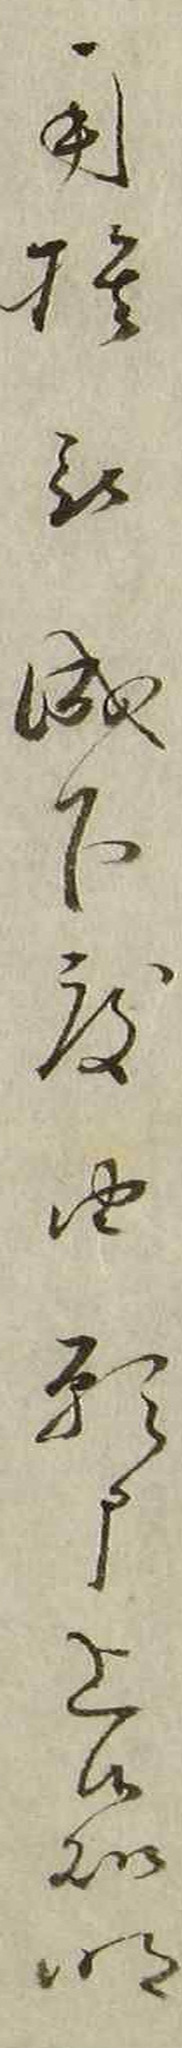用捨被成下度由願申上候処明
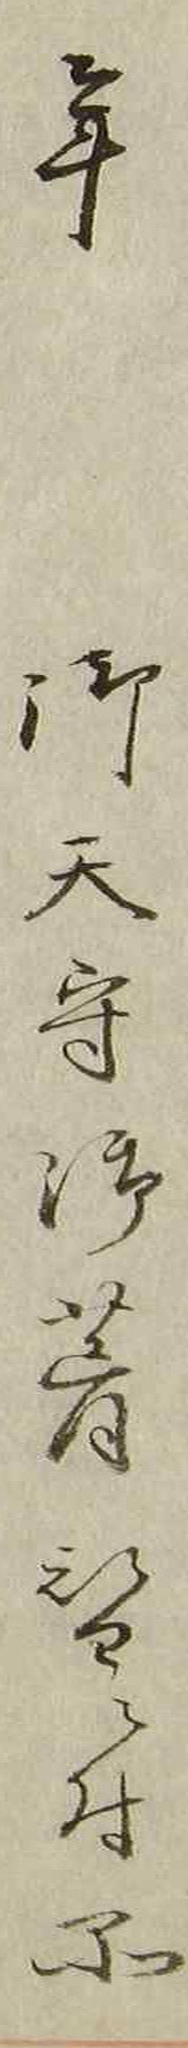年御天守御葺替ニ付品
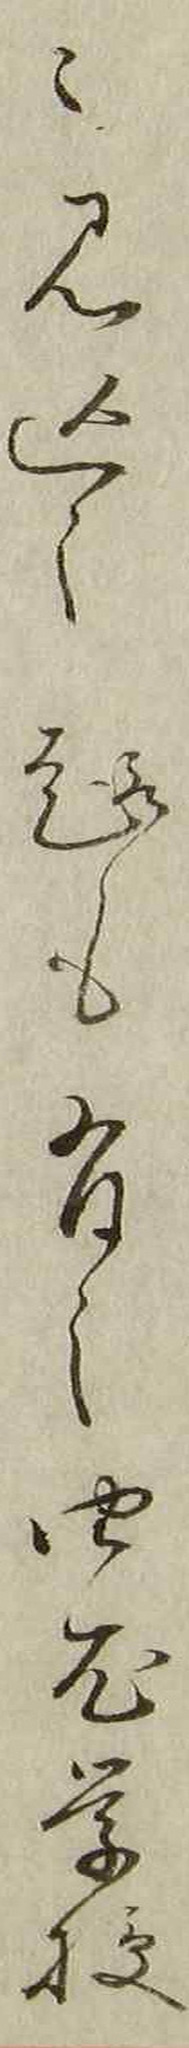々見込之趣も有之由尤学校
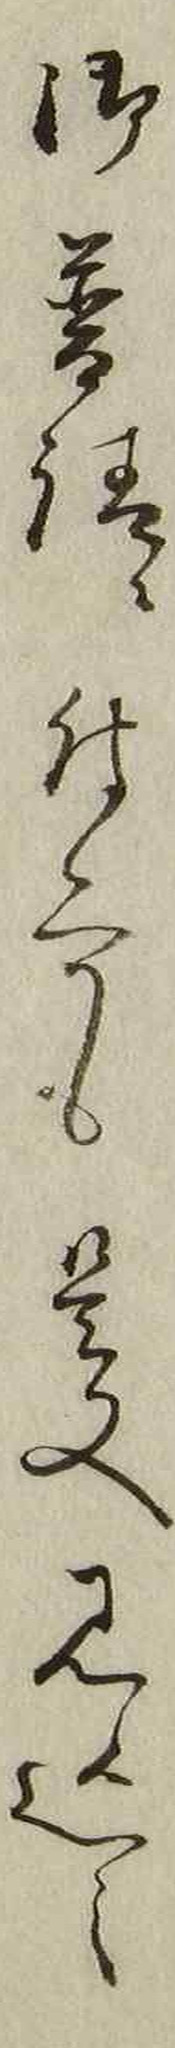御普請ニ付而も是又見込之
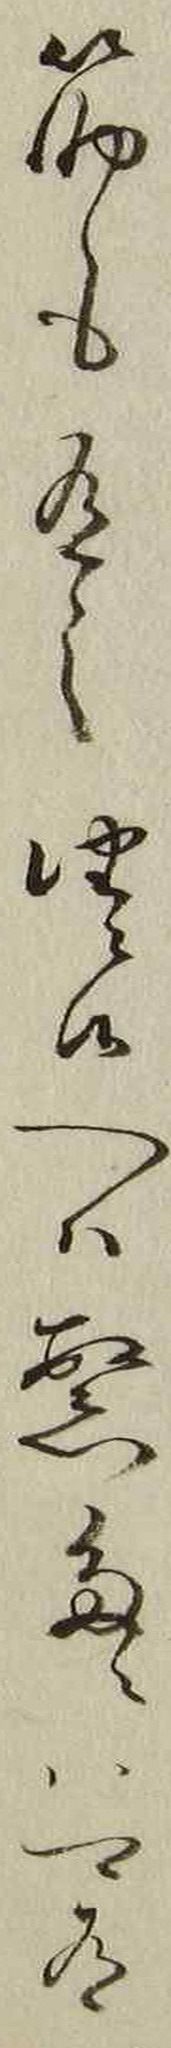筋も有之由ニ候へハ繁多ニハ可有
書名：諸士系譜　巻之8　い之部8
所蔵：会津若松市立会津図書館
